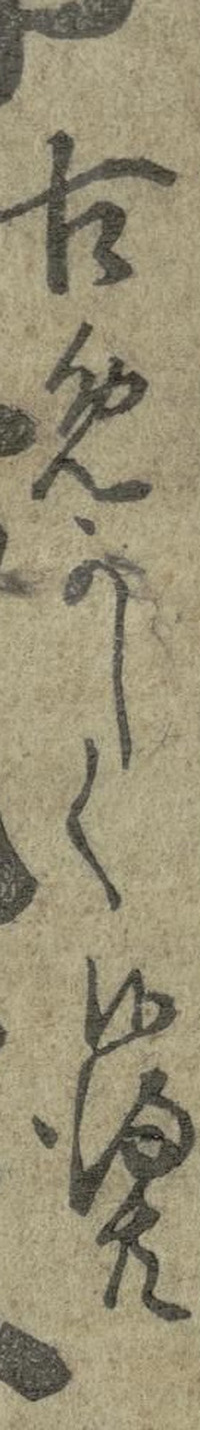京都古めかしく候得共
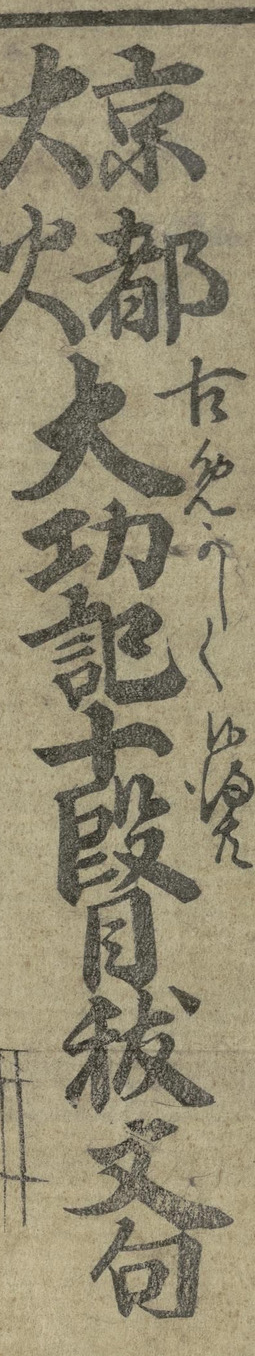大火大功記十段目祓文句
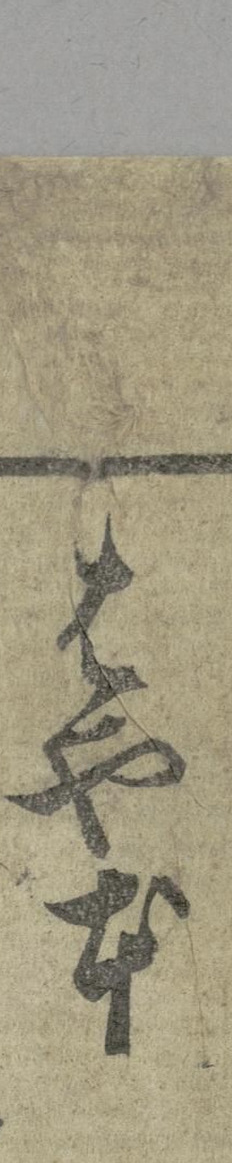はや本
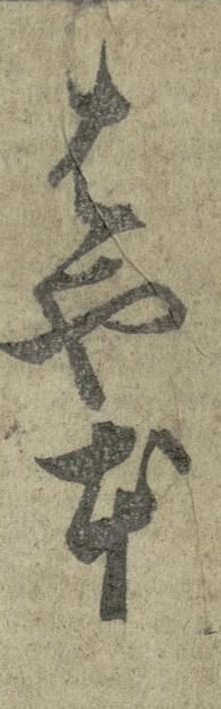はや本
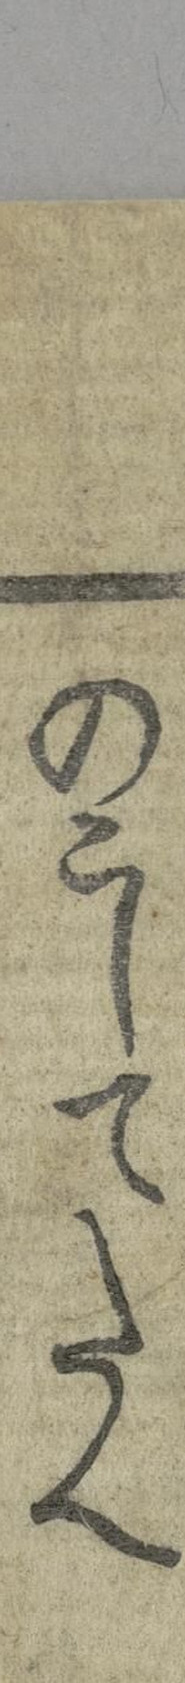のこしてたへ
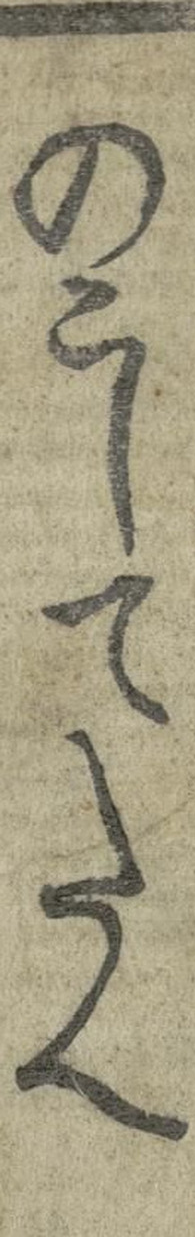のこしてたへ
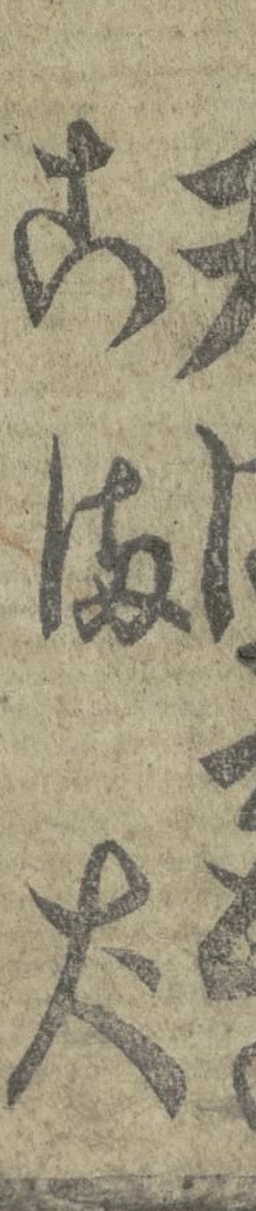こま犬
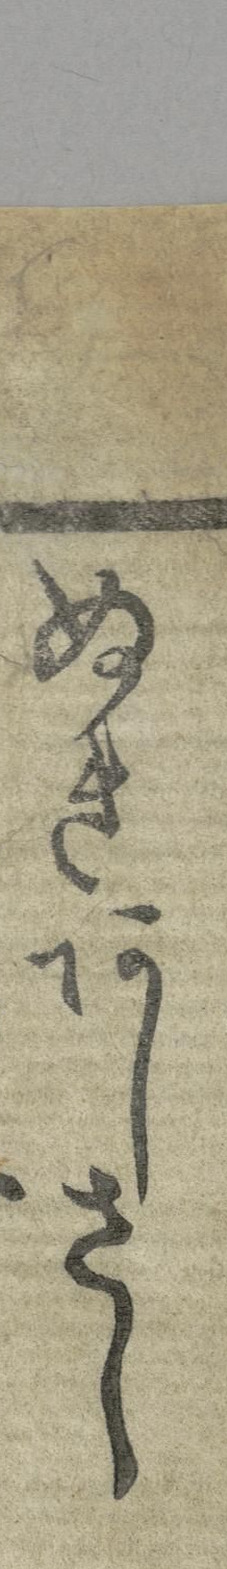ぬきあしさし
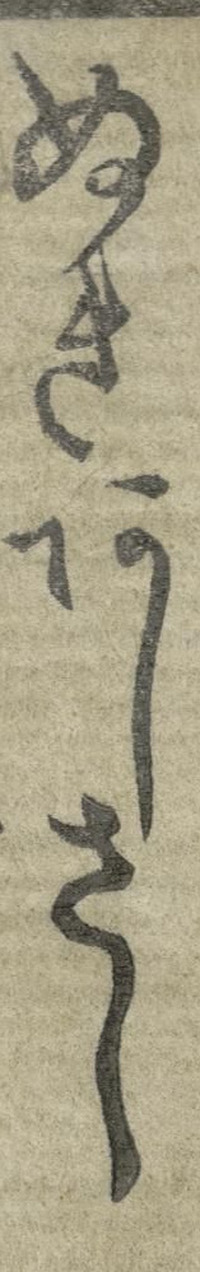ぬきあしさし
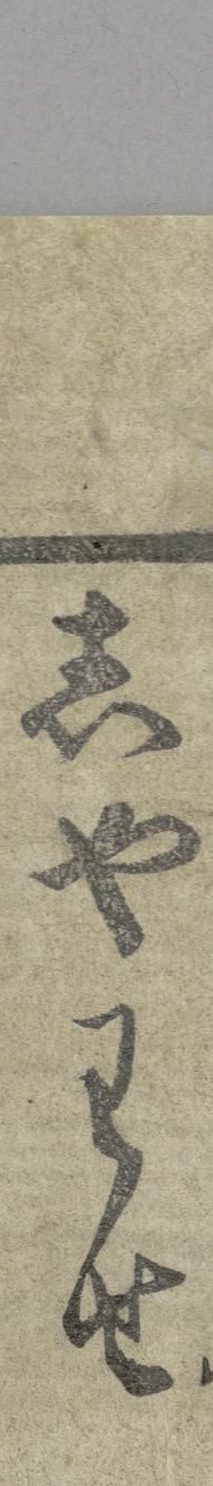しやわせ
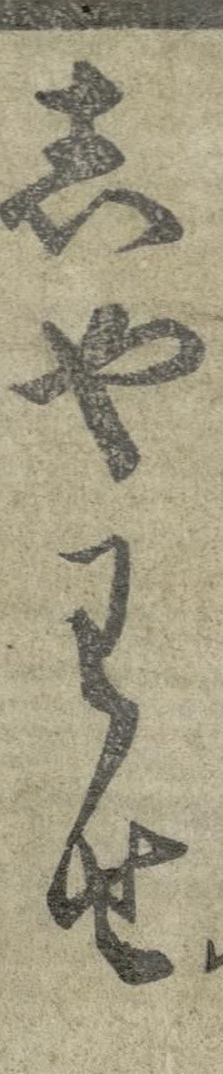しやわせ
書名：京都大火大功記十段目祓文句
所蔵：東京大学地震研究所図書室 Earthquake Research Institute Library, The University of Tokyo, JAPAN
